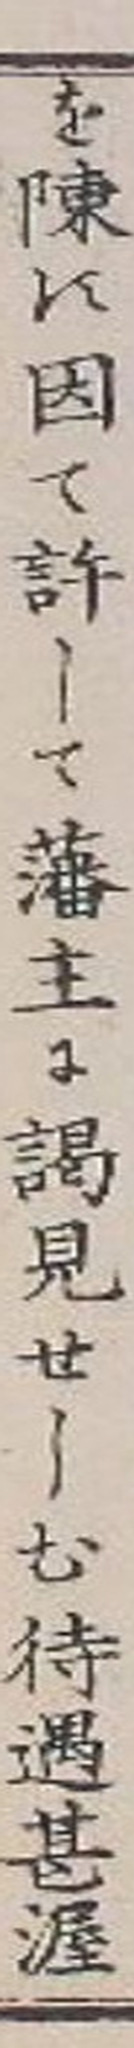を陳す因て許して藩主に謁見せしむ待遇甚渥
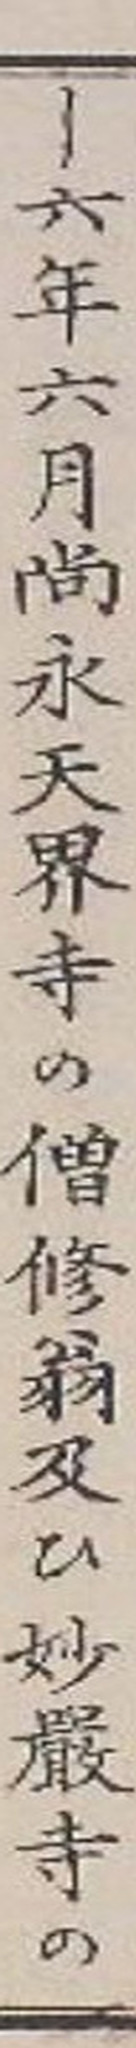し六年六月尚永天界寺の僧修翁及ひ妙厳寺の
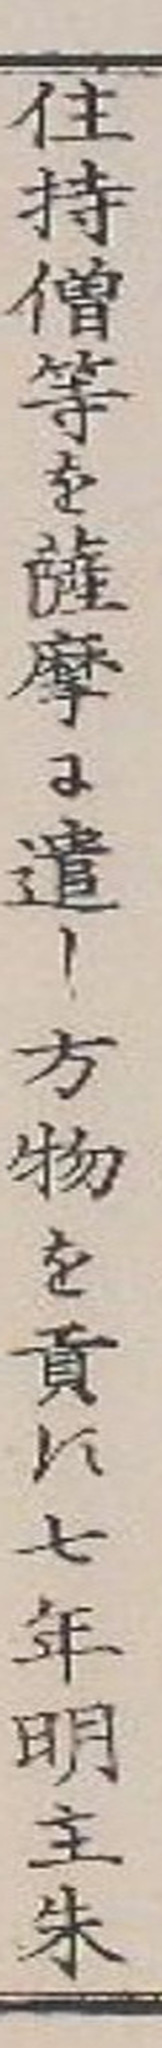住持僧等を薩摩に遣し方物を貢す七年明主朱
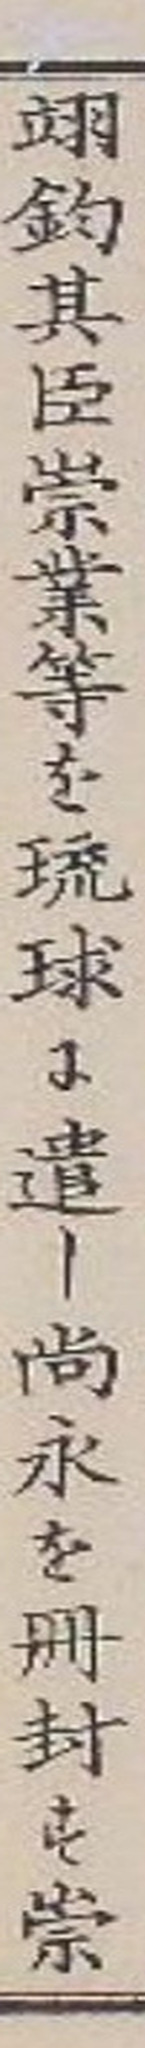翊鈞其臣崇業等を琉球に遣し尚永を冊封す崇
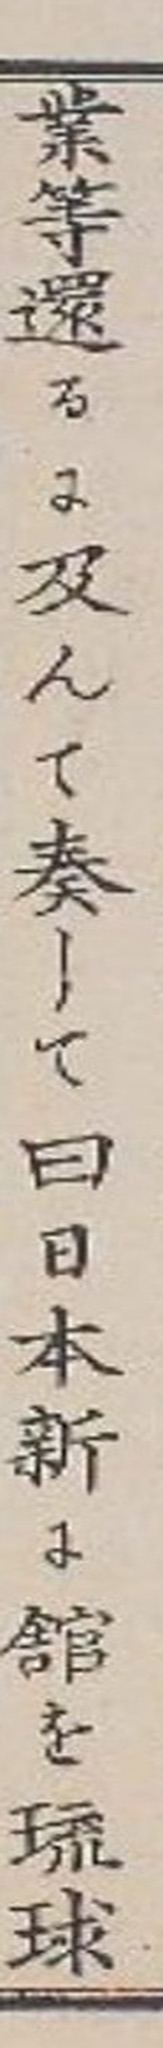業等還るに及んて奏して曰日本新に館を琉球
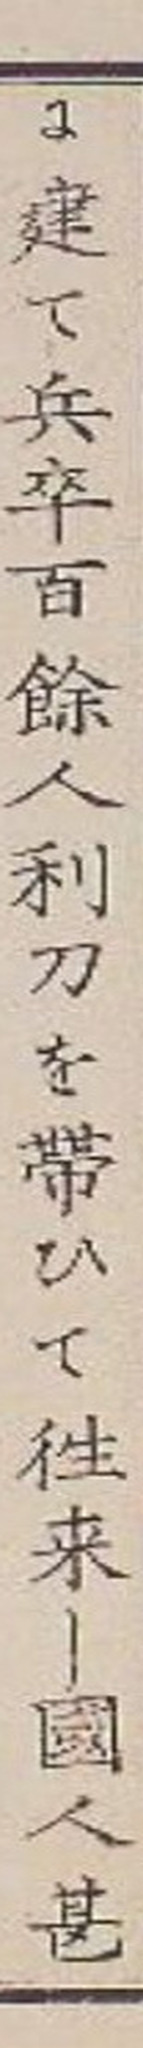に建て兵卒百余人利刀を帯ひて往来し国人甚
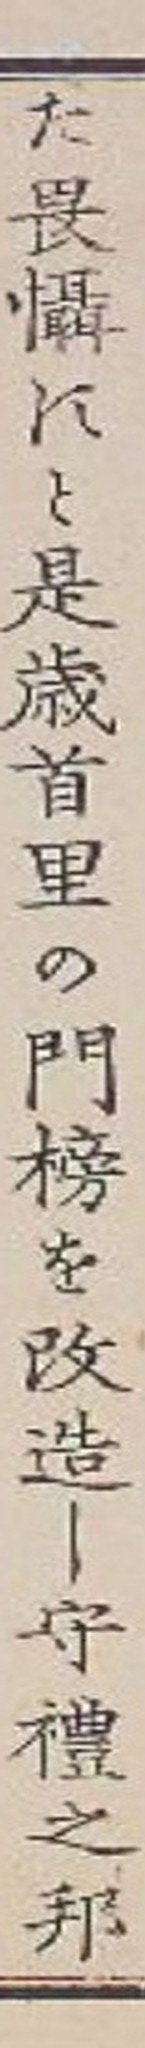た畏懾すと是歳首里の門榜を改造し守礼之邦
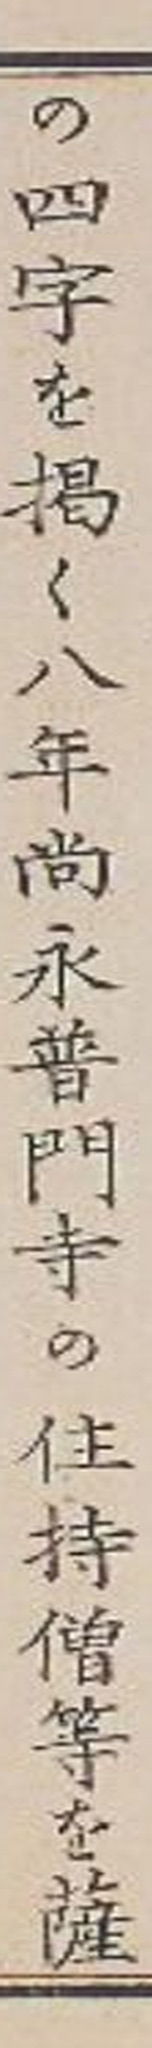の四字を掲く八年尚永普門寺の住持僧等を薩
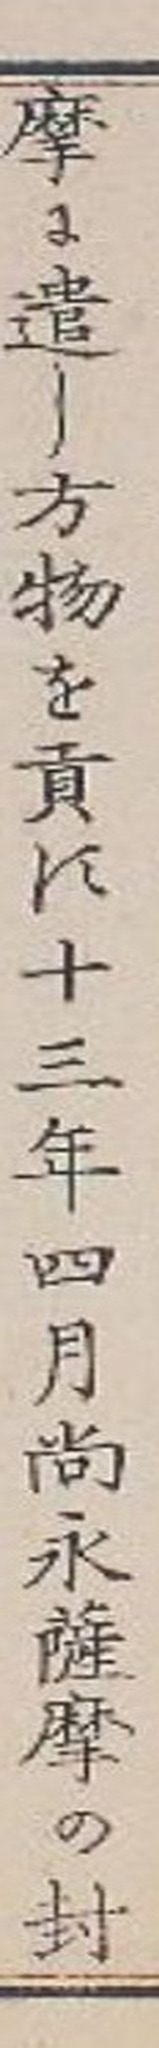摩に遣し方物を貢す十三年四月尚永薩摩の封
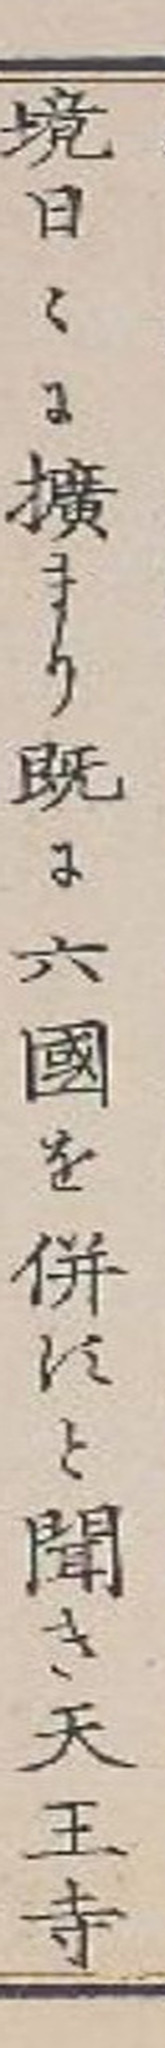境日々に拡まり既に六国を併すと聞き天王寺
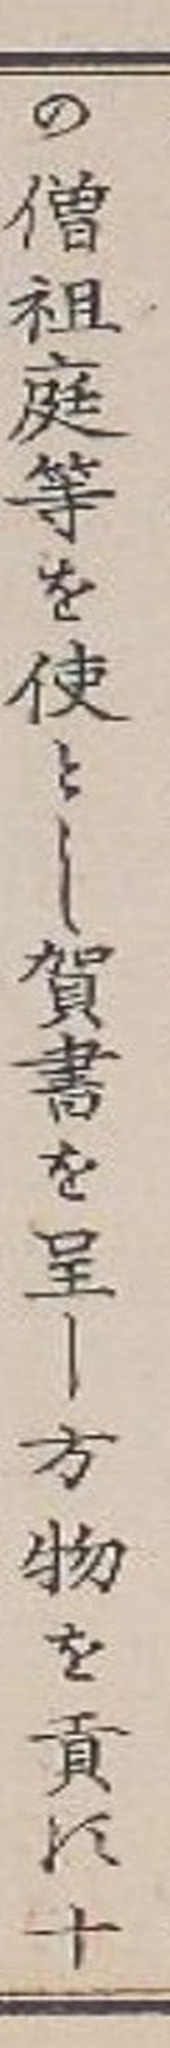の僧祖庭等を使とし賀書を呈し方物を貢す十
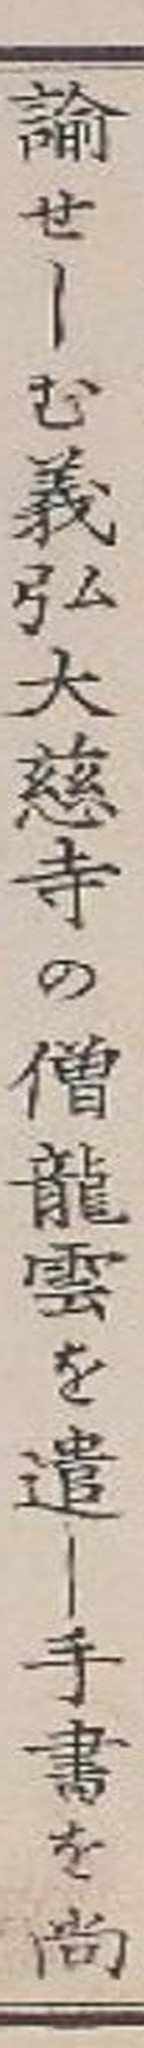諭せしむ義弘大慈寺の僧龍雲を遣し手書を尚
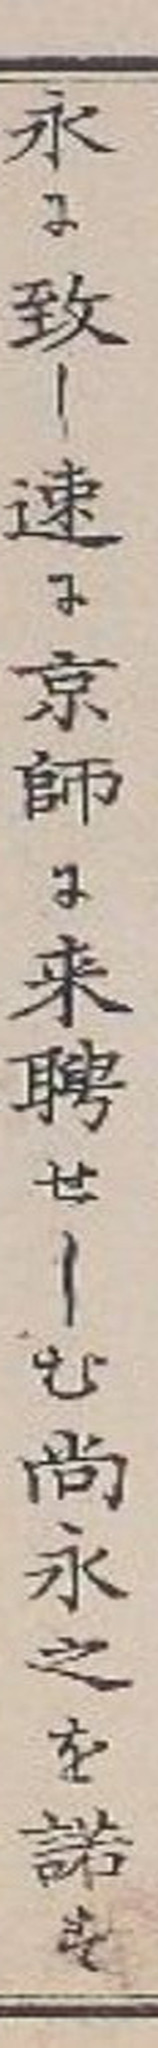永に致し速に京師に来聘せしむ尚永之を諾す
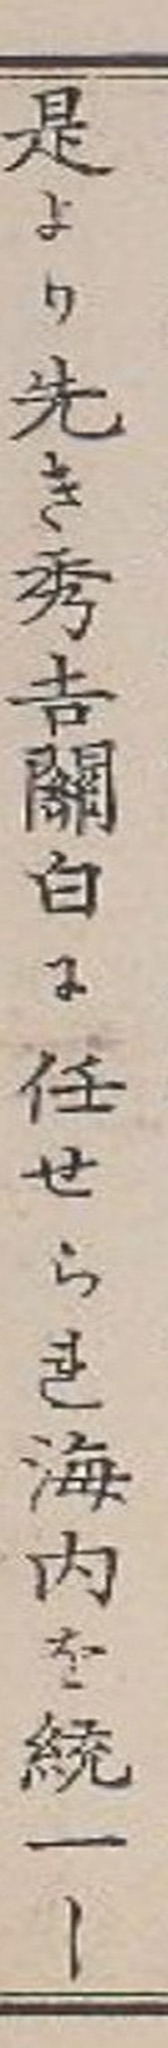是より先き秀吉関白に任せられ海内を統一し

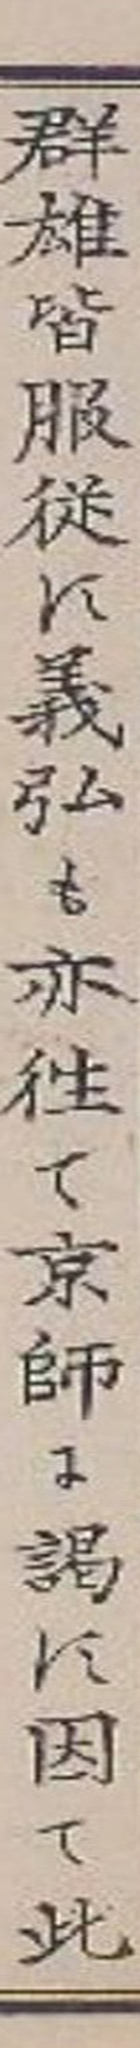群雄皆服従す義弘も亦往て京師に謁す因て此
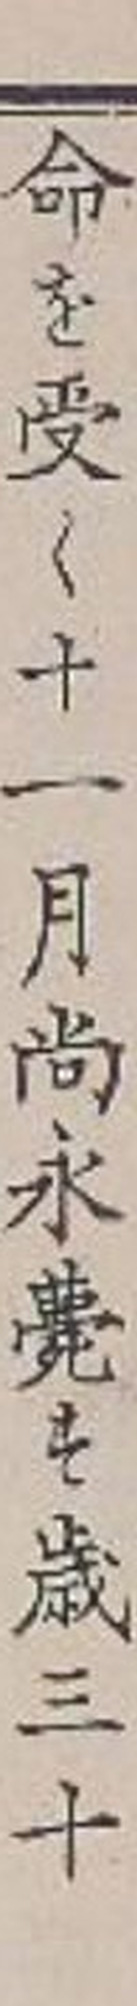命を受く十一月尚永薨す歳三十
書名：南島紀事 中
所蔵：University of the Ryukyus Library
